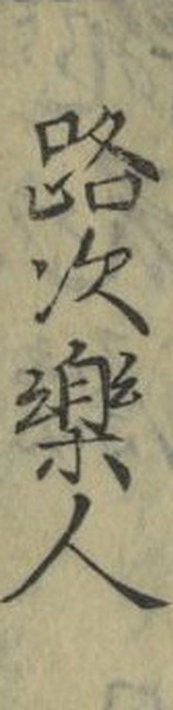路次樂人
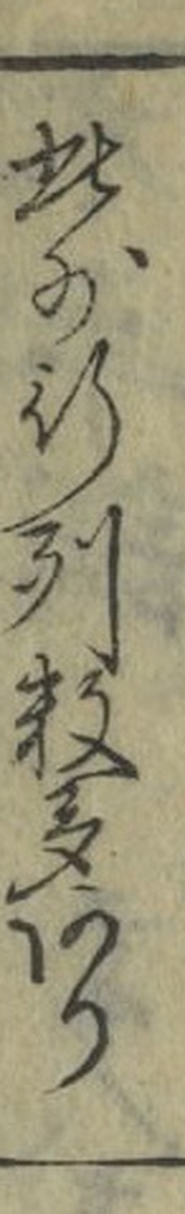此外行列数多あり
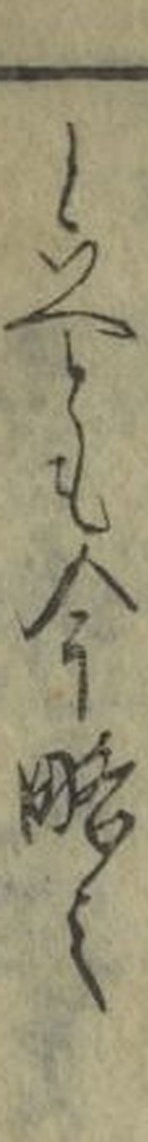といへとも今略之

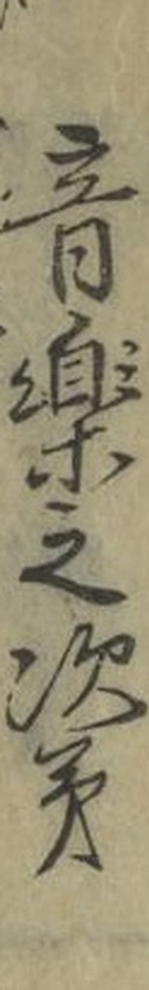音樂之次第
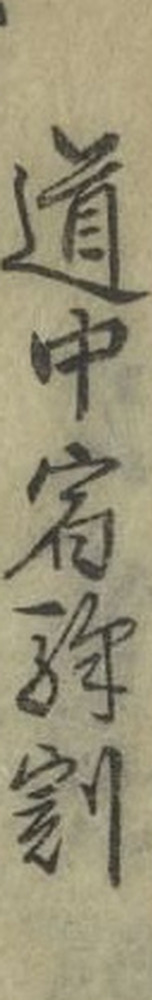道中宿驛割
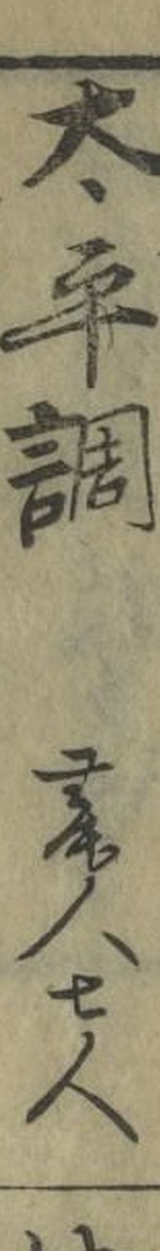大平調舞人七人
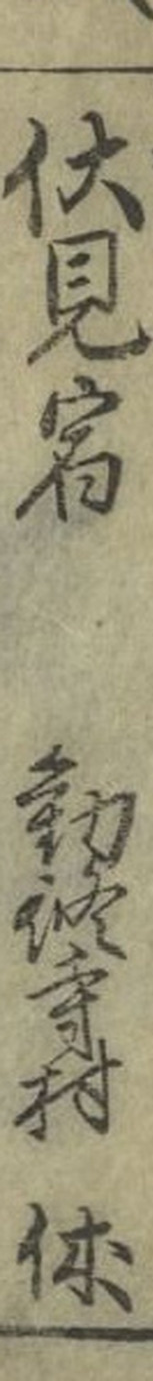伏見宿勧修寺村休
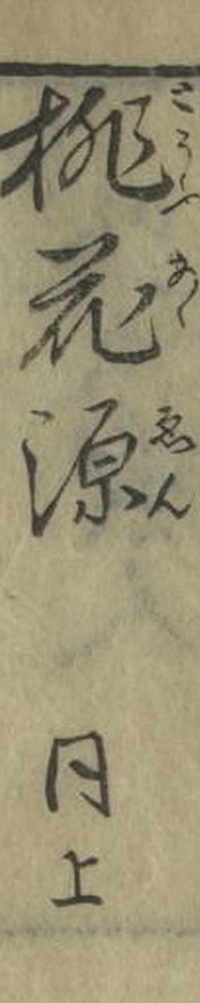桃花源同上
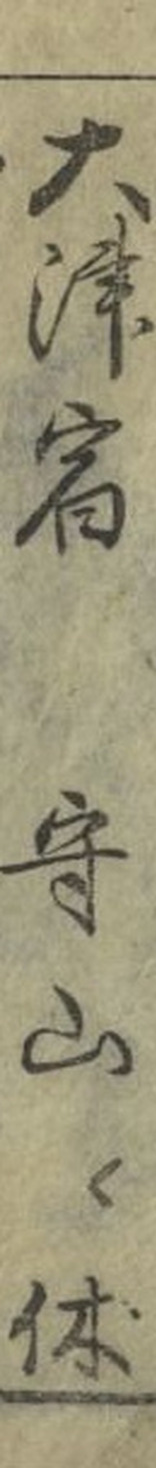大津宿守山休
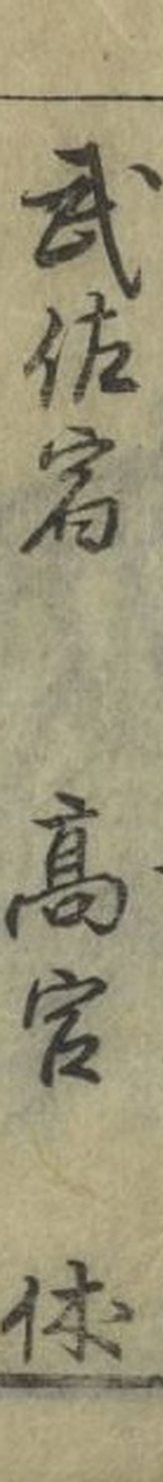武佐宿高宮休
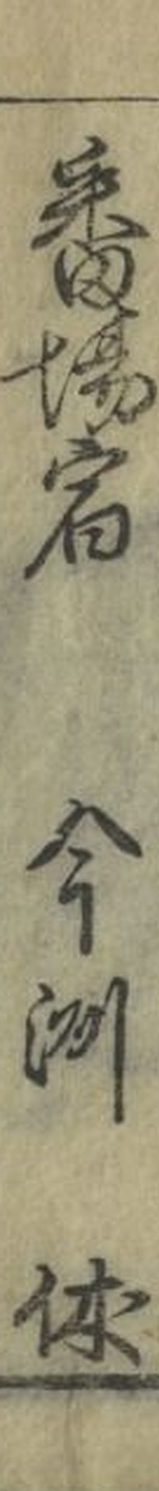番場宿今洲休
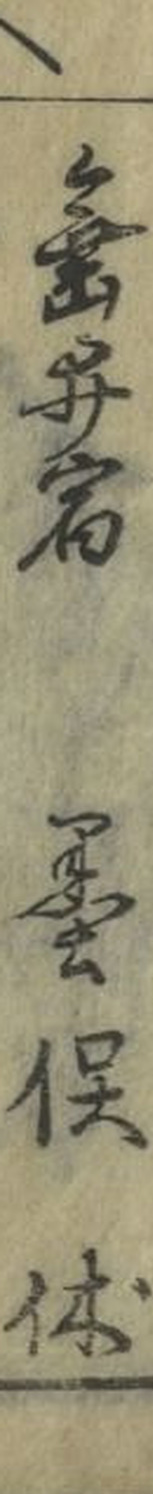垂井宿墨俣休
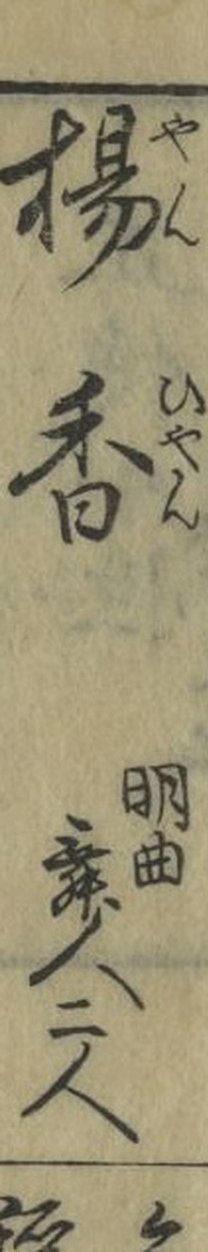楊香明曲舞人二人
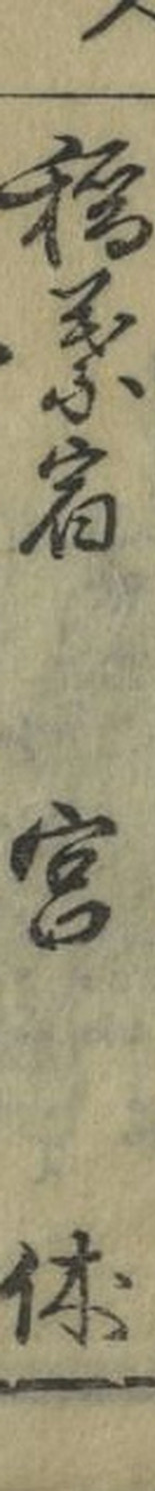稲葉宿宮休
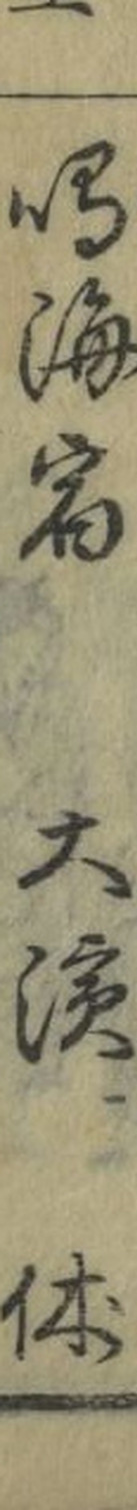鳴海宿大濱休
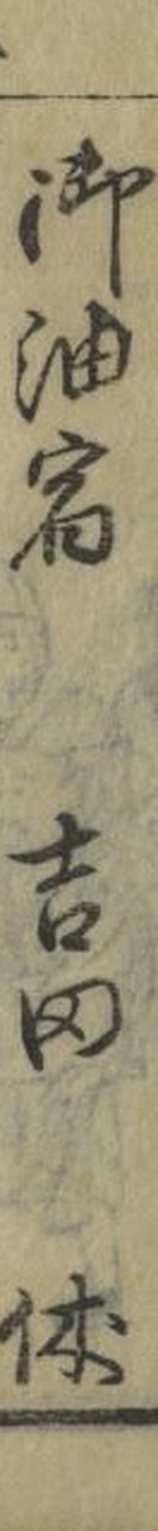御油宿吉田休
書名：[琉球人行列記]
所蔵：University of the Ryukyus Library
